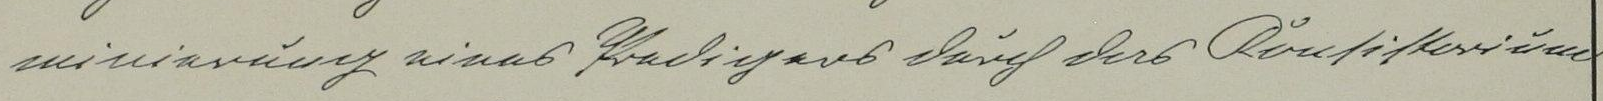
minierung eines Predigers durch das Konsistorium
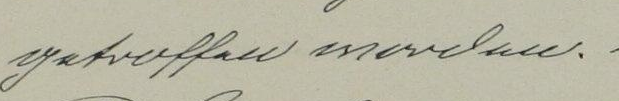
getroffen worden.
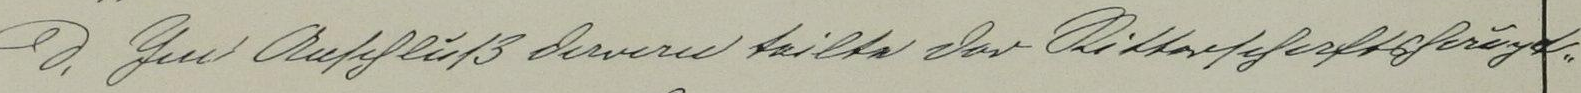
d. Im Anschluß daran teilte der Ritterschaftshaupt-
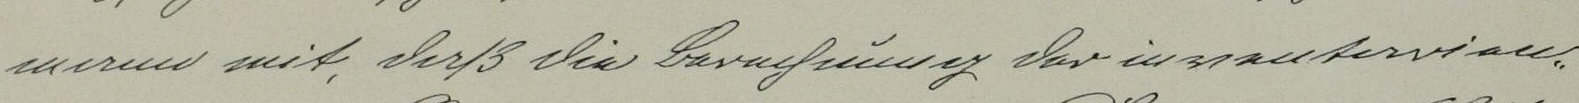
mann mit, daß die Berechnung der inventarien-
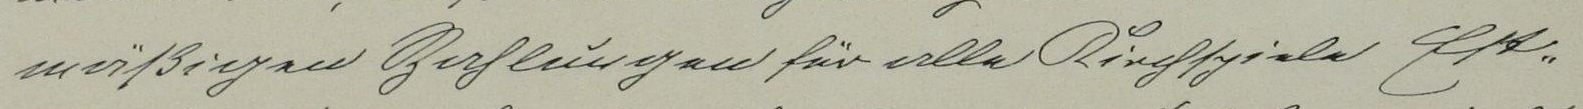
mäßigen Zahlungen für alle Kirchspiele Est-
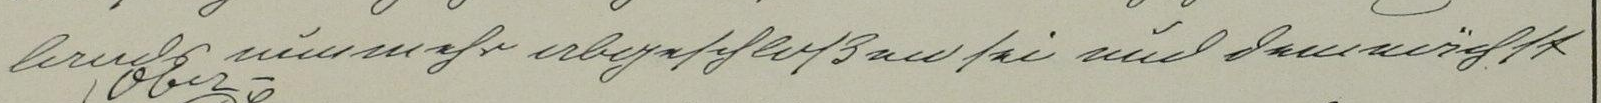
lands nunmehr abgeschloßen sei und demnächst
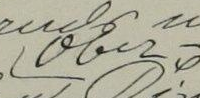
Ober
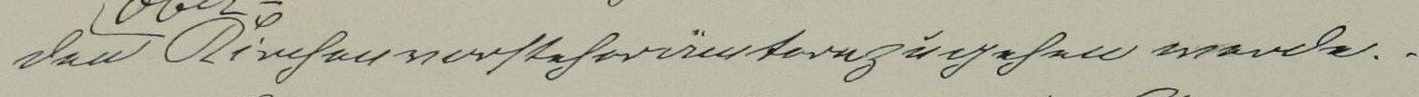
den Kirchenvorsteherämtern zugehen werde.
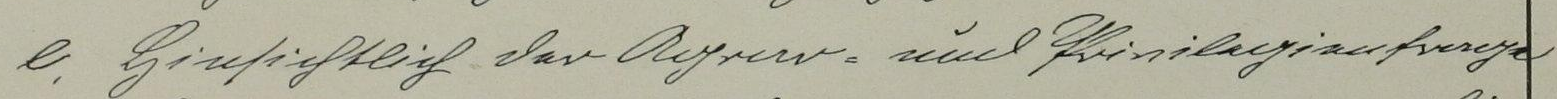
e. Hinsichtlich der Agrar- und Privilegienfrage
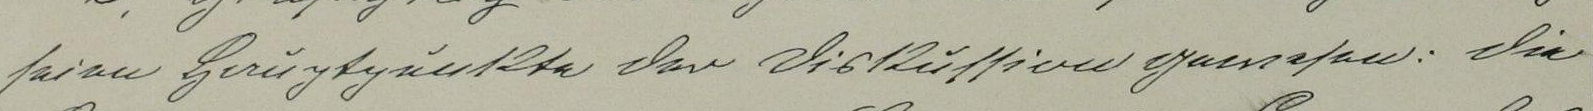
seien Hauptpunkte der Diskussion gewesen: die
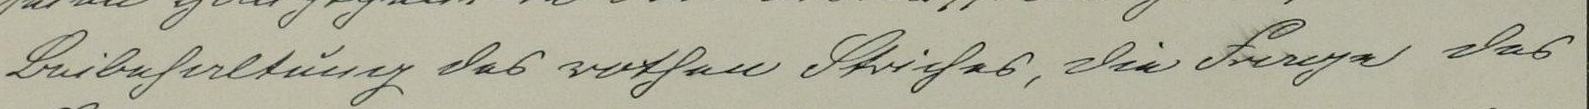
Beibehaltung des rothen Striches, die Frage des
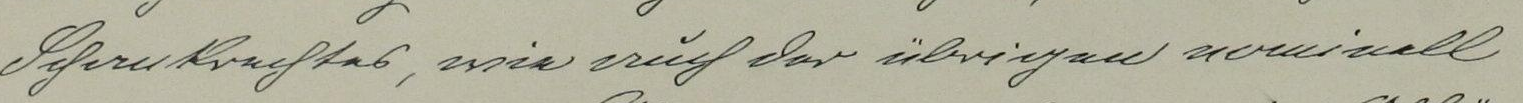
Schankrechtes, wie auch der übrigen nominell
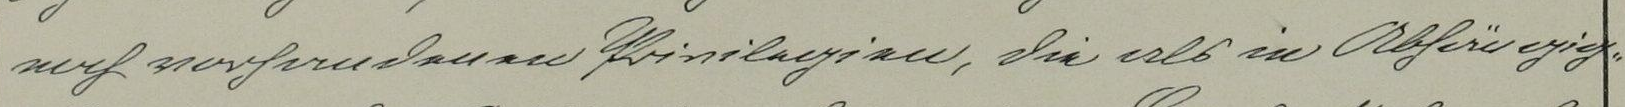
noch vorhandenen Privilegien, die als in Abhängig-
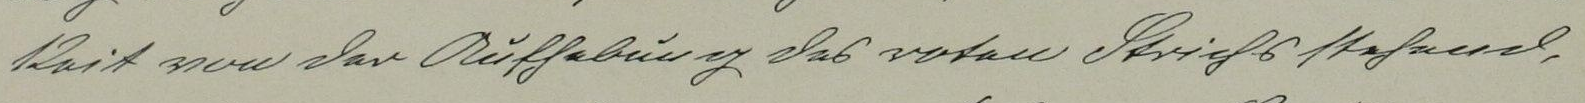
keit von der Aufhebung des roten Strichs stehend,
